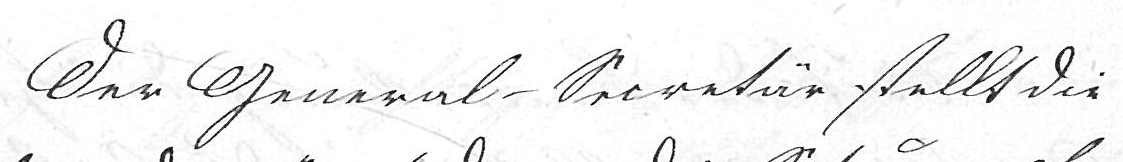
Der General-Secretär stellt die
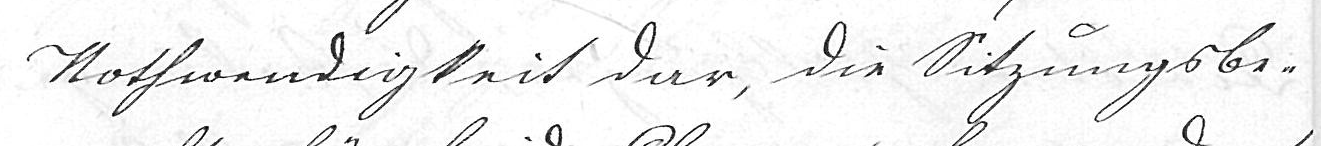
Nothwendigkeit dar, die Sitzungsbe-
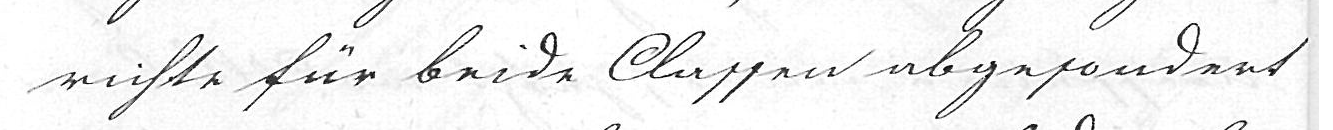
richte für beide Classen abgesondert
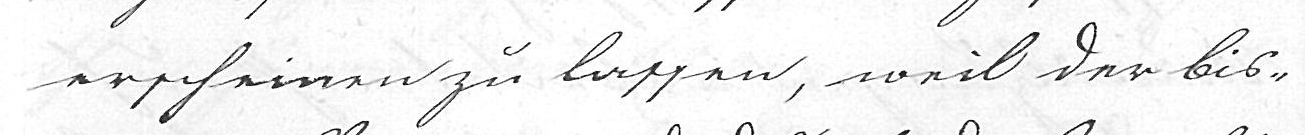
erscheinen zu lassen, weil der bis-
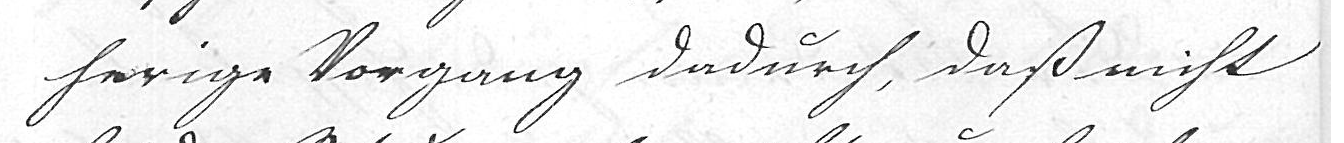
herige Vorgang dadurch, daß nicht
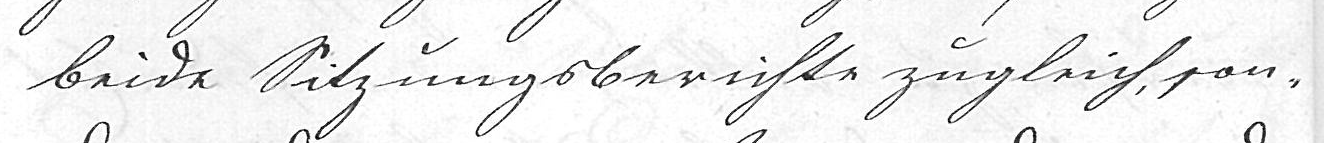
beide Sitzungsberichte zugleich, son-
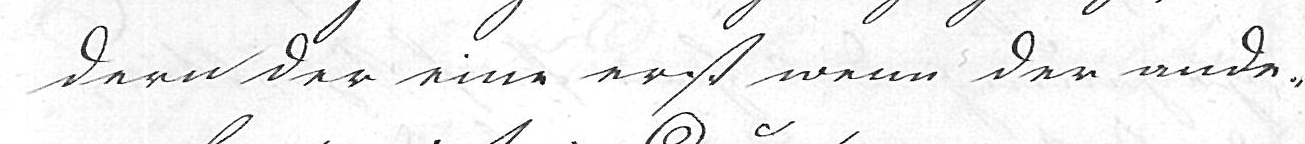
deren der eine erst wenn der ande-
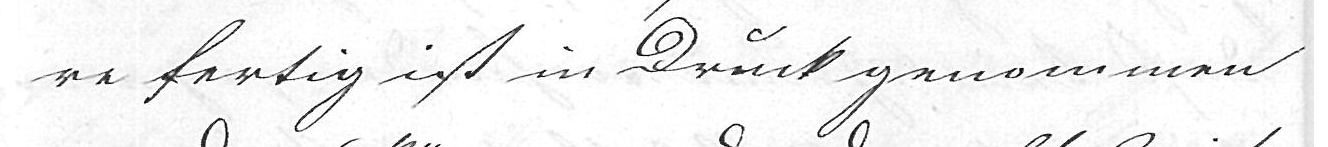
re fertig ist in Druck genommen
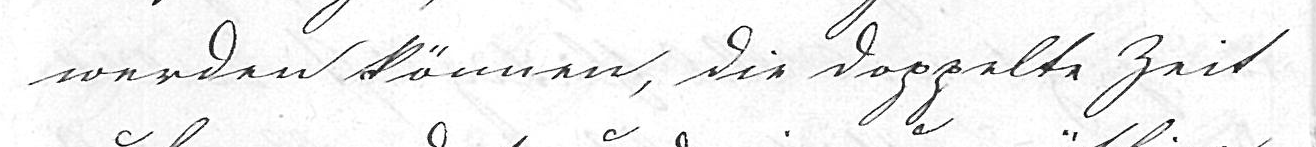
werden können, die doppelte Zeit
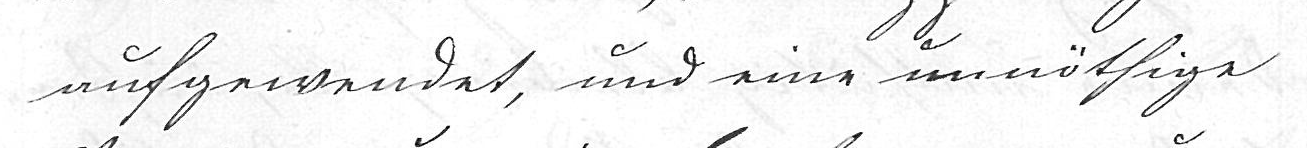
aufgewendet, und eine unnöthige
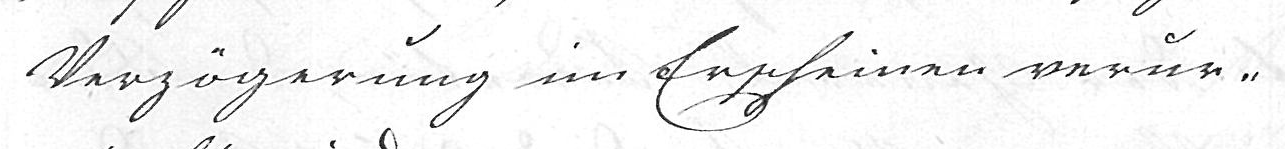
Verzögerung im Erscheinen verur-
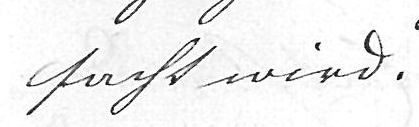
sacht wird.
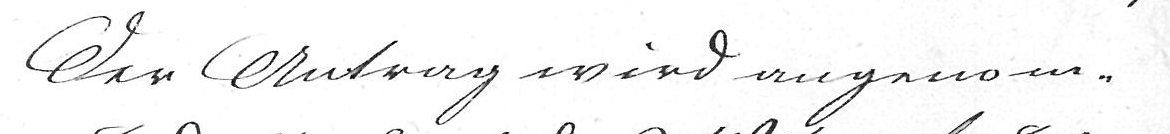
Der Antrag wird angenom-
